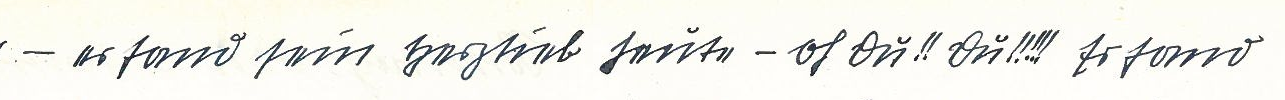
– er fand sein Herzlieb heute – oh Du!! Du!!!!! Er fand
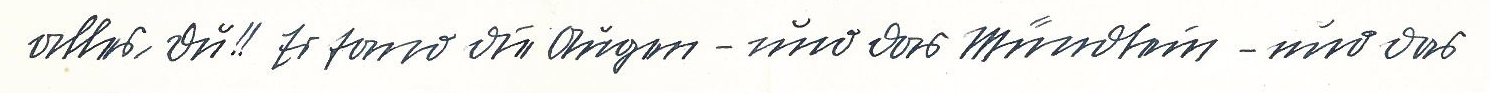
alles, Du!! Er fand die Augen – und das Mündlein – und das
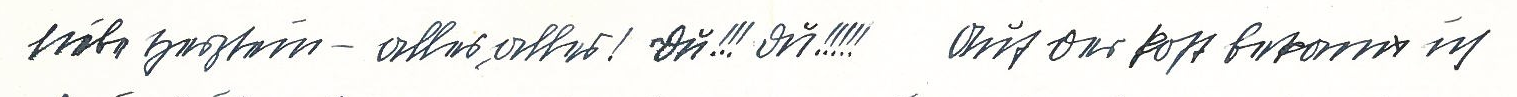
liebe Herzlein – alles, alles! Du!!! Du!!!!! Auf der Post bekam ich
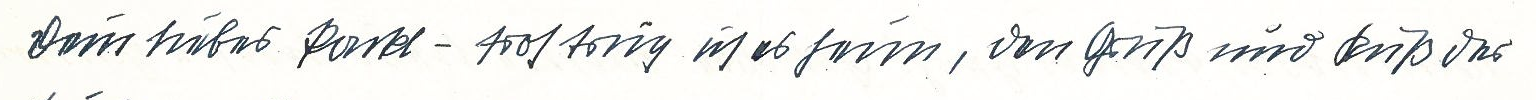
Dein liebes Packl – froh trug ich es heim, den Gruß und Kuß der
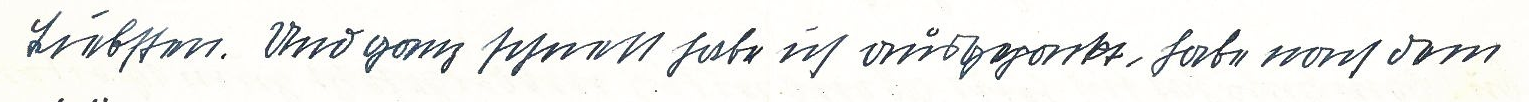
Liebsten. Und ganz schnell habe ich ausgepackt, habe nach dem
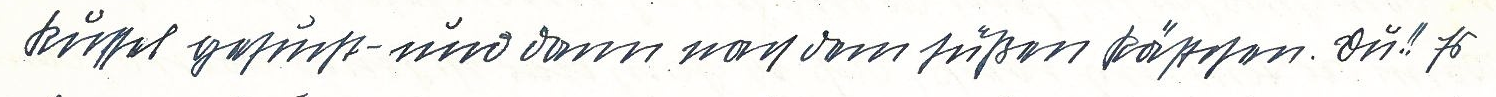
Kussel gesucht – und dann nach dem süßen Kästchen. Du!! Es
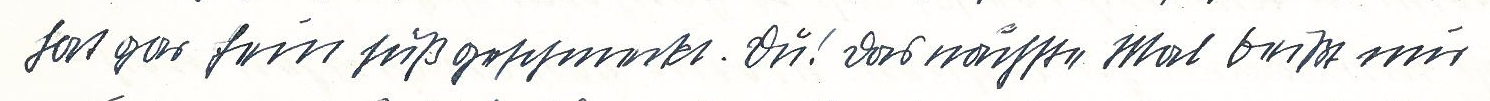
hat gar fein süß geschmeckt. Du! Das nächste Mal beißt mir
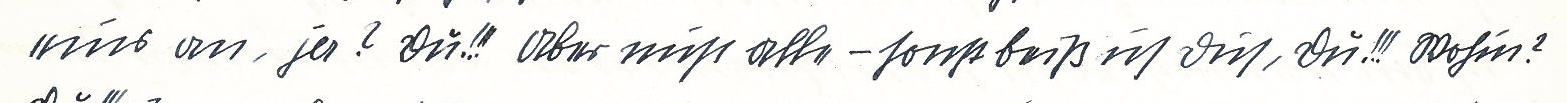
eins an, ja? Du!!! Aber nicht alle – sonst beiß ich Dich, Du!!! Wohin?
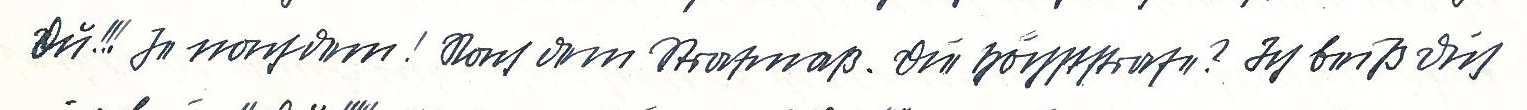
Du!!! Je nach dem! Nach dem Strafmaß. Die Höchststrafe? Ich beiß Dich
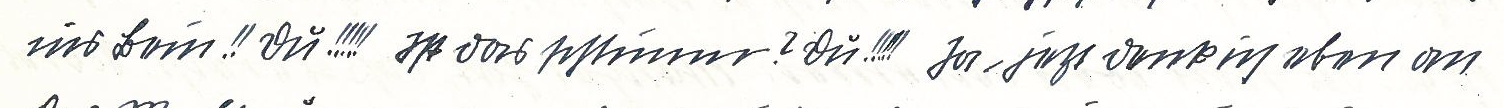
ins Bein!! Du!!!!! Ist das schlimmer? Du!!!!! Ja, jetzt denke ich eben an
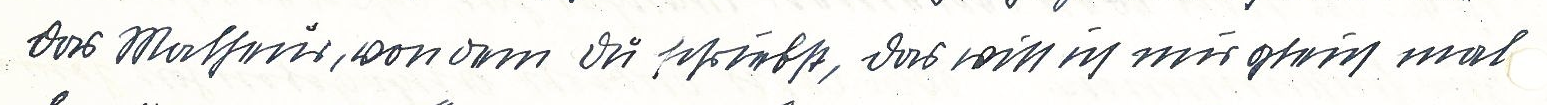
das Malheur, von dem Du schriebst, das will ich mir gleich mal
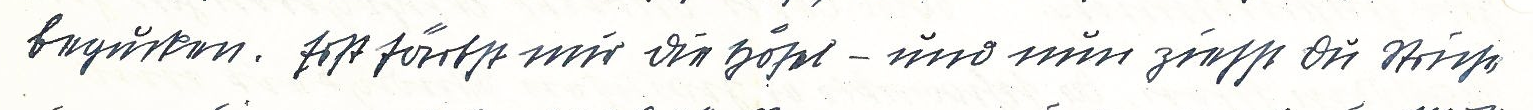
begucken. Erst färbst mir die Hösel – und nun ziehst Du Striche
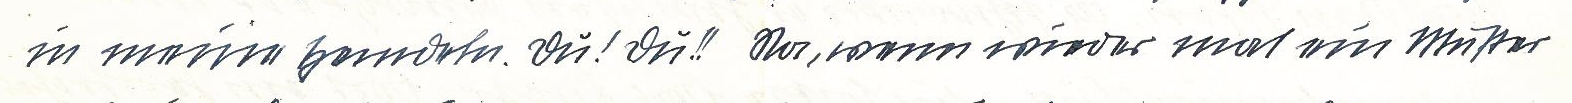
in meine Hemdeln. Du! Du!! Na, wenn wieder mal ein Muster
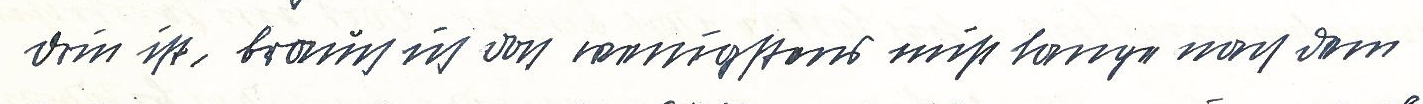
drin ist, brauch ich doch wenigstens nicht lange nach dem
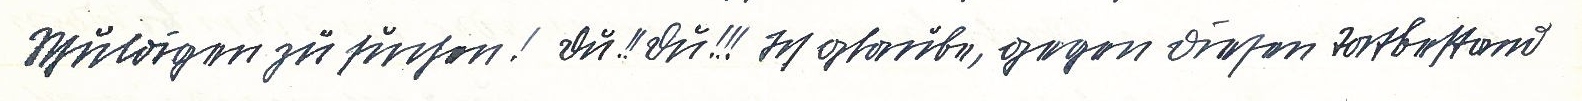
Schuldigen zu suchen! Du!! Du!!! Ich glaube, gegen diesen Tatbestand
